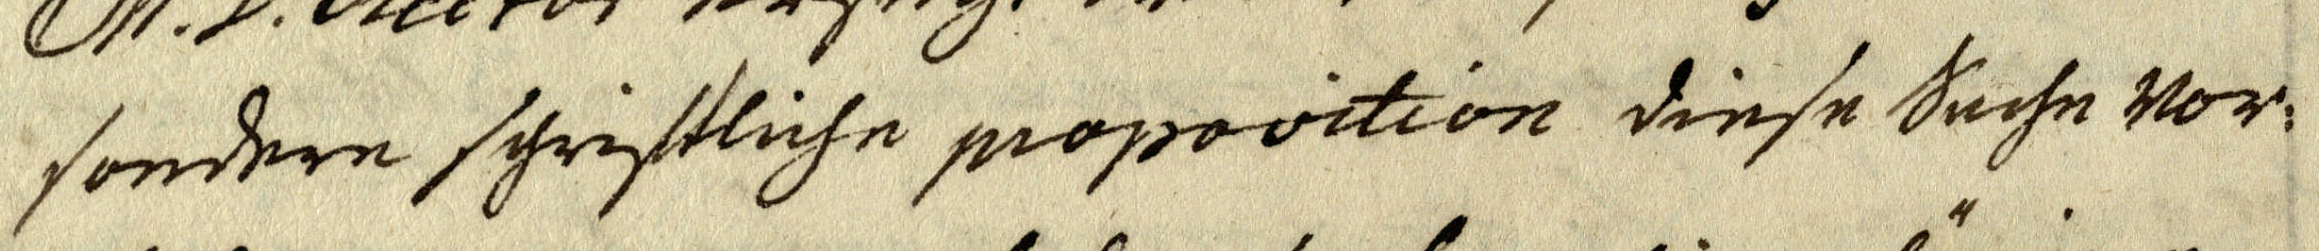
sondere schriftliche proposition diese Sache vor¬
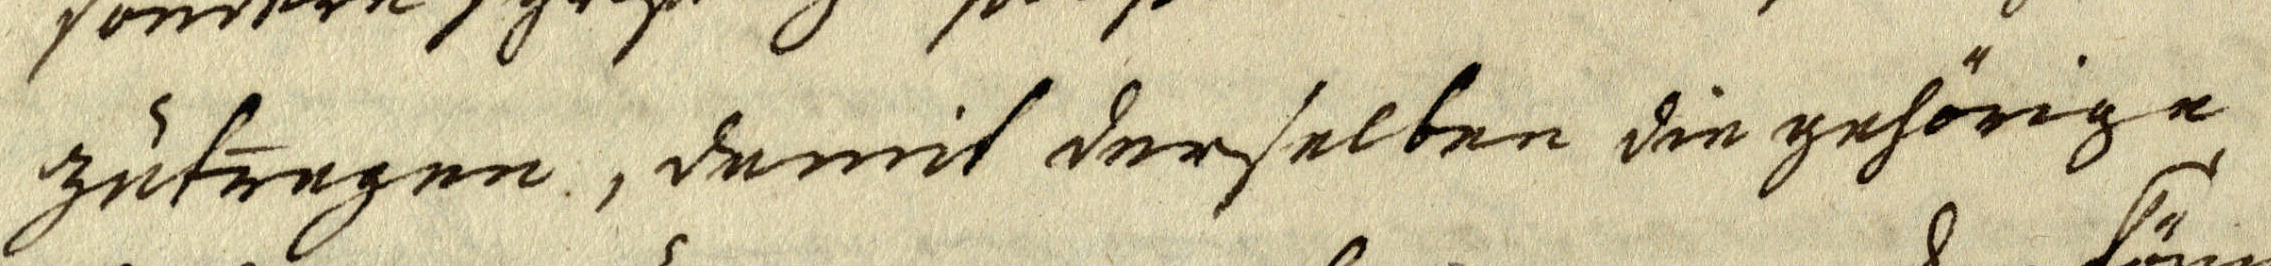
zutragen, damit derselben die gehörige
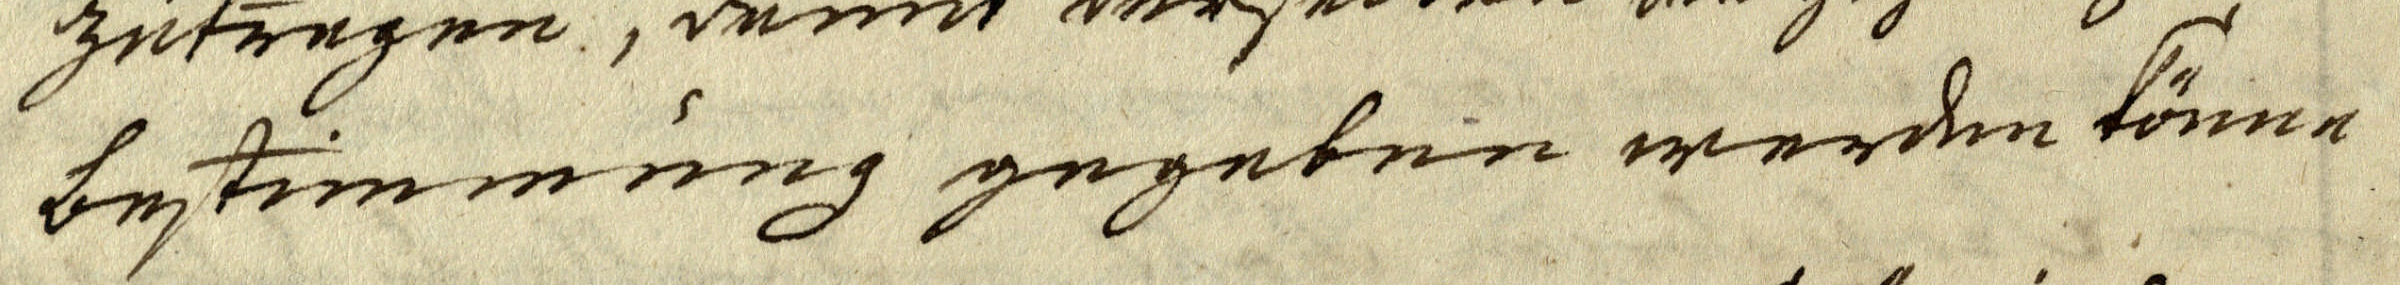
Bestimmung gegeben werden könne.
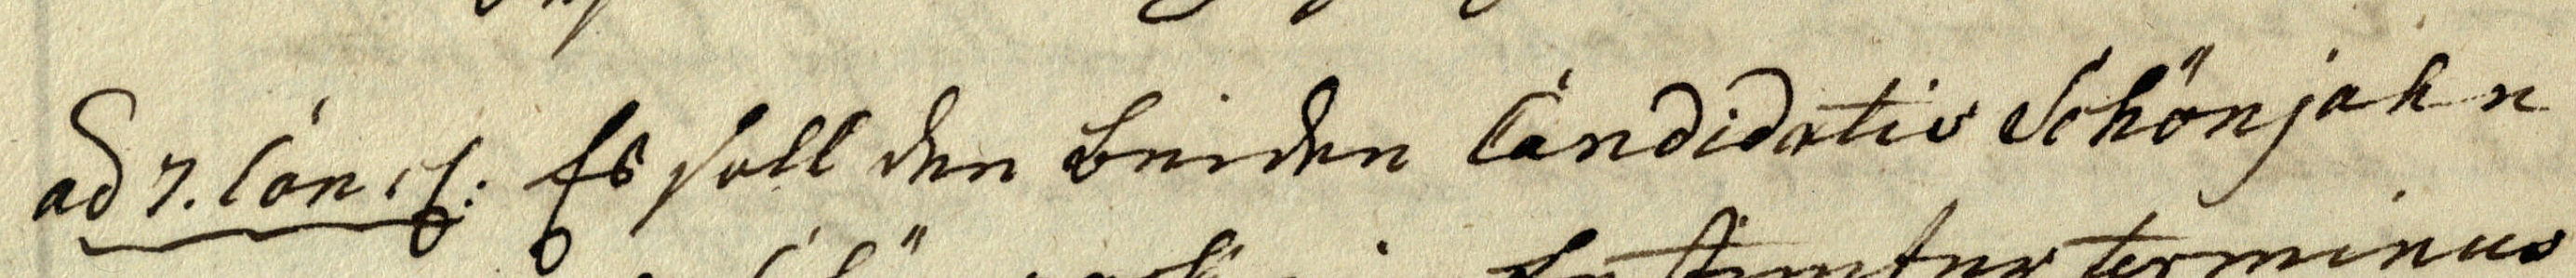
Concl. Es soll den beiden Candidatis Schönjahn
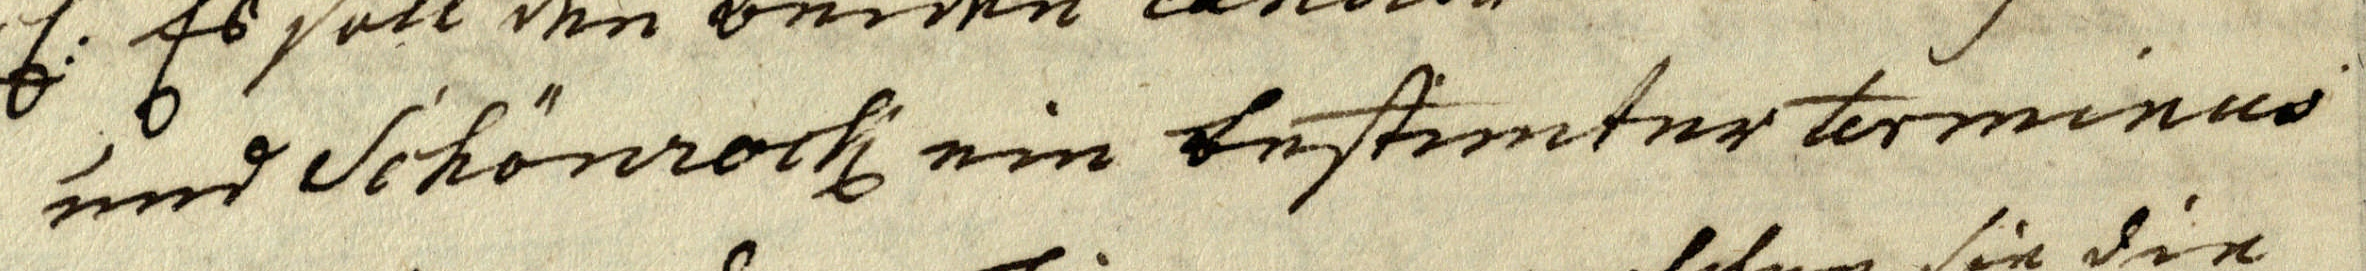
und Schönrock ein bestimter terminus
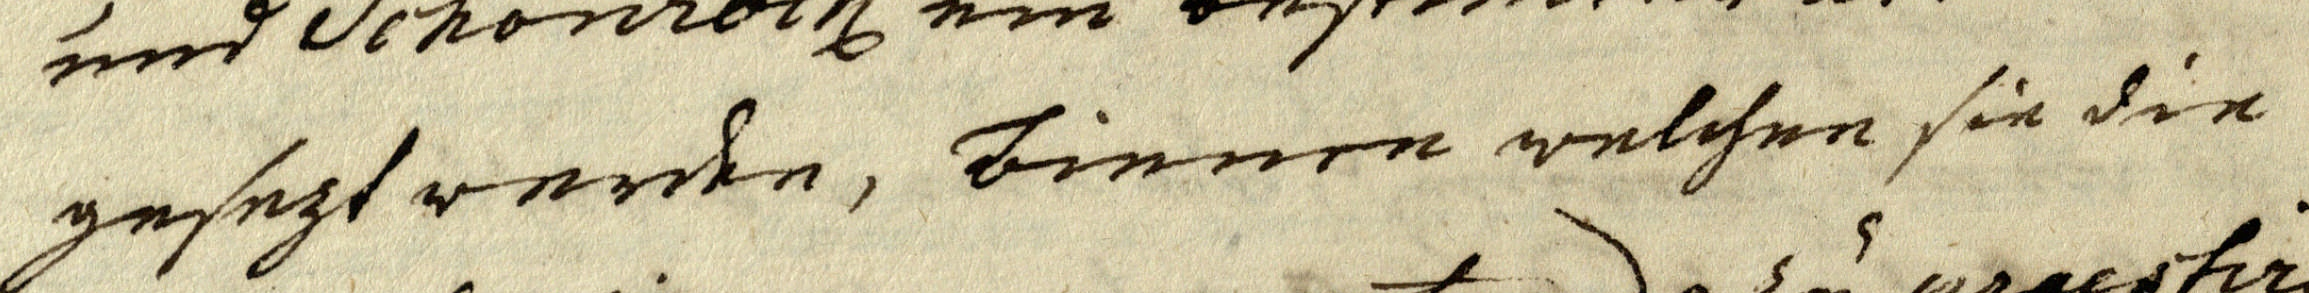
gesezt werden, binnen welchen sie die
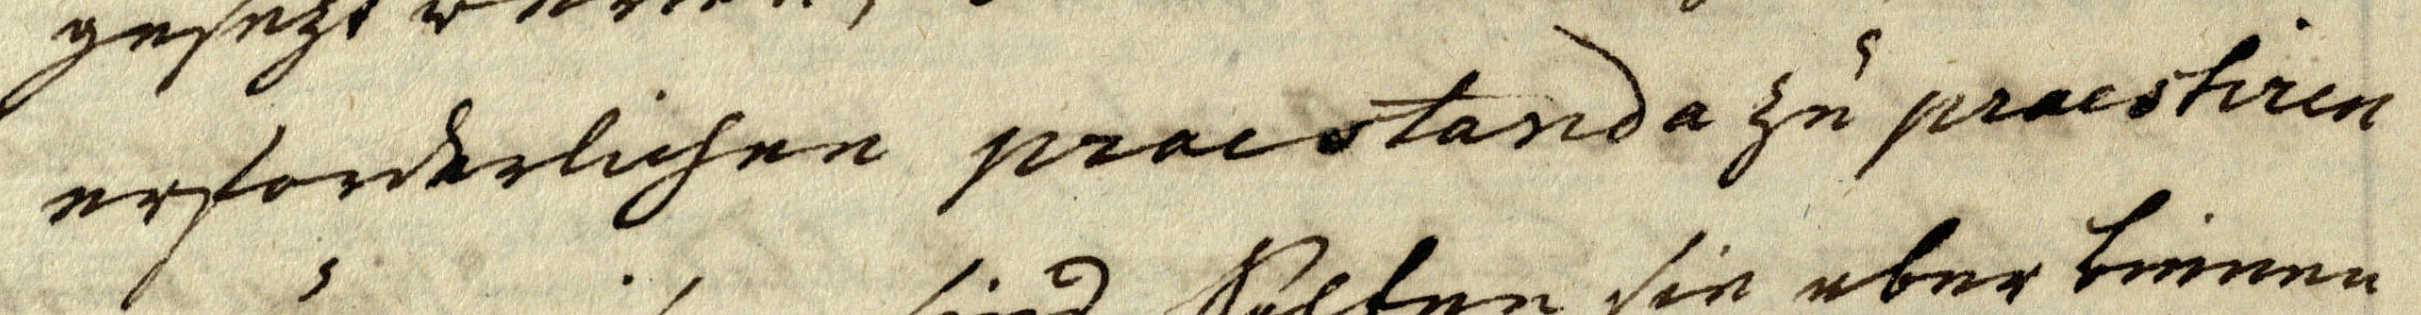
erforderlichen praestanda zu praestiren
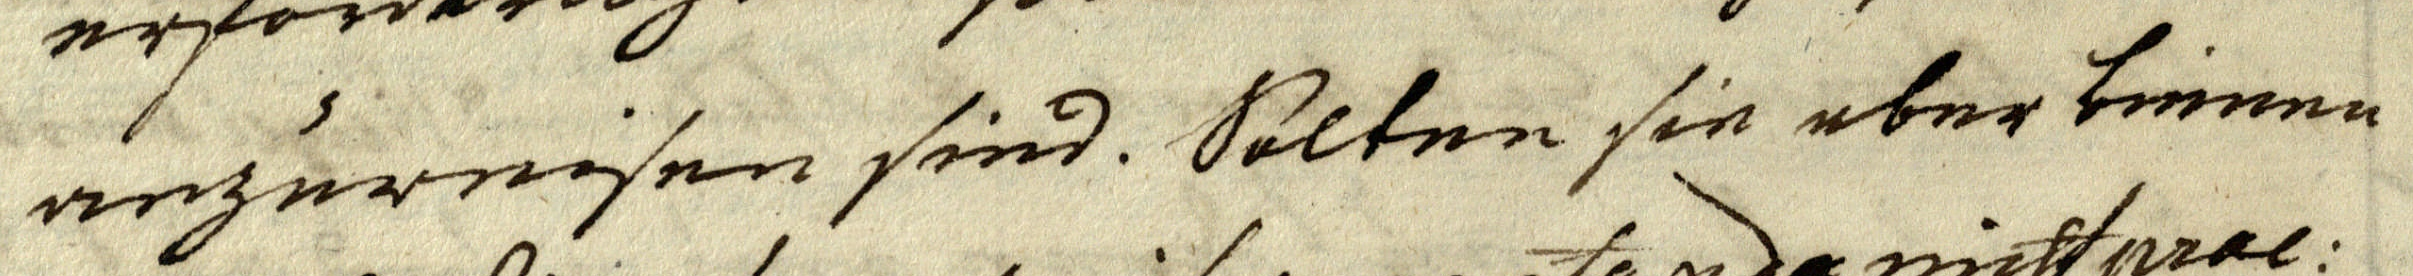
anzuweisen sind. Solten sie aber binnen
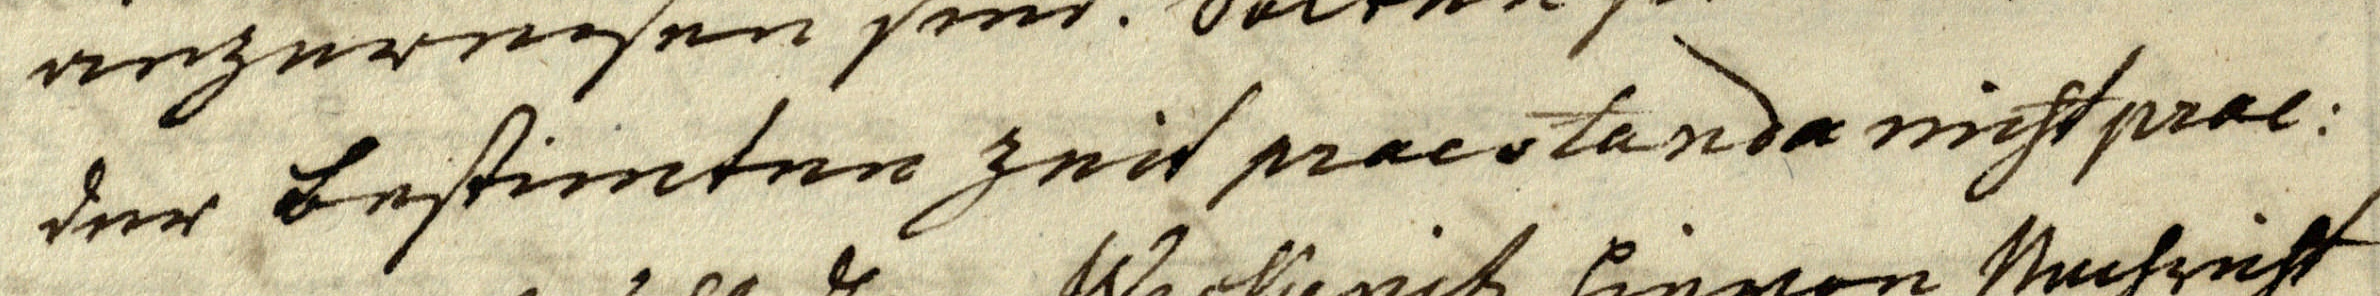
der bestimten Zeit praestanda nicht prae¬
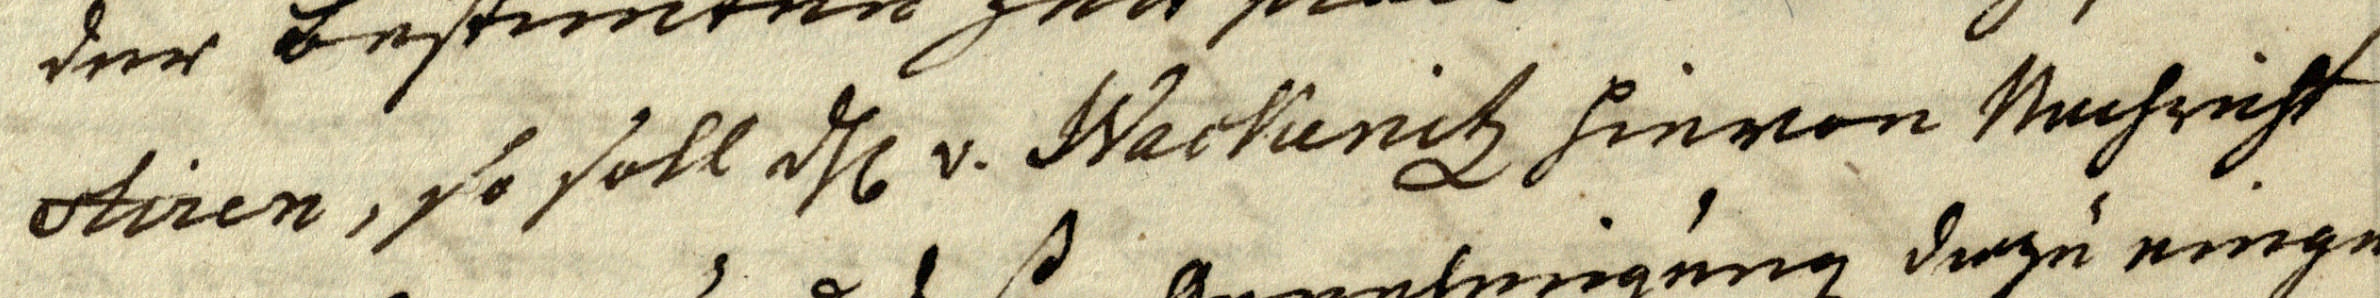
stiren, so soll dh v. Wackenitz hievon Nachricht
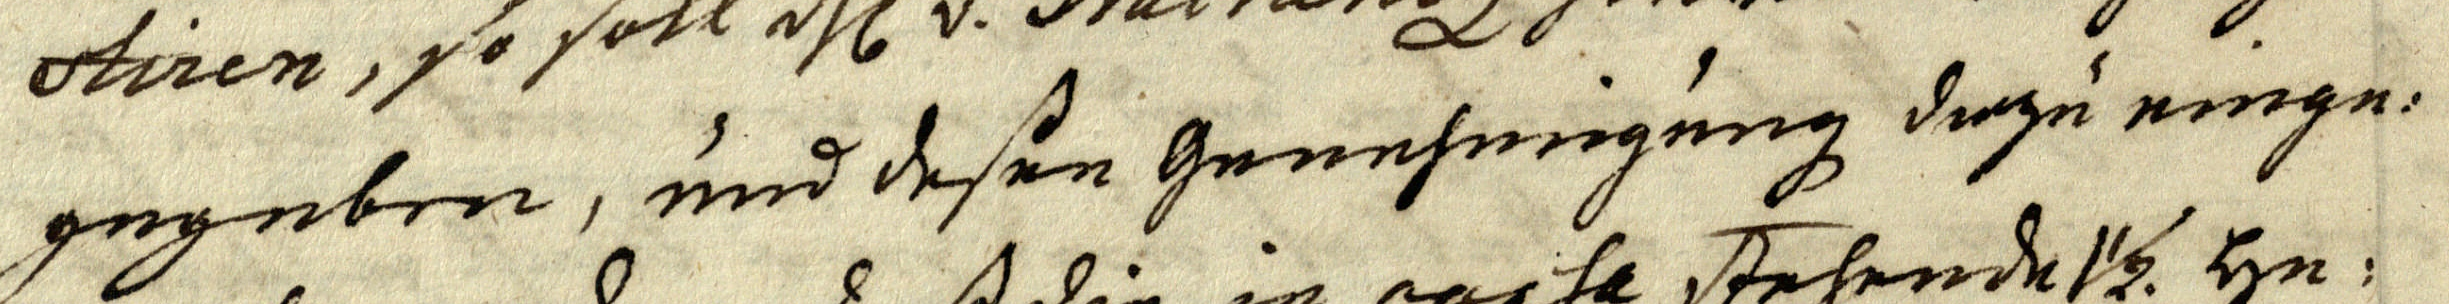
gegeben, und deßen Genehmigung dazu einge¬
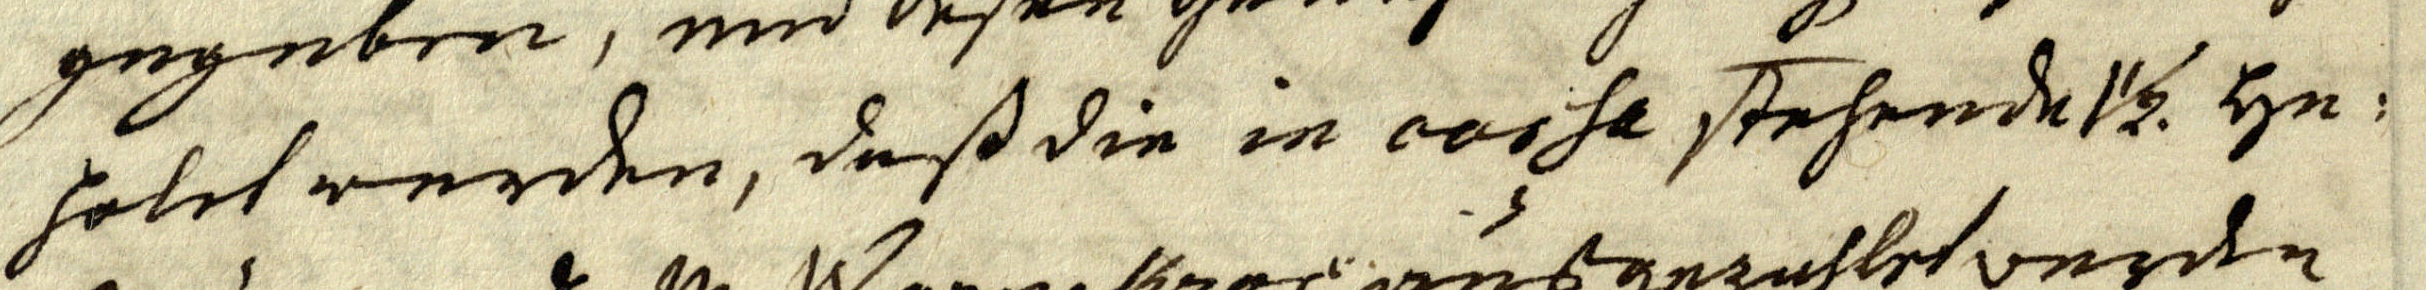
holet werden, daß die in cassa stehende 1½ . He¬
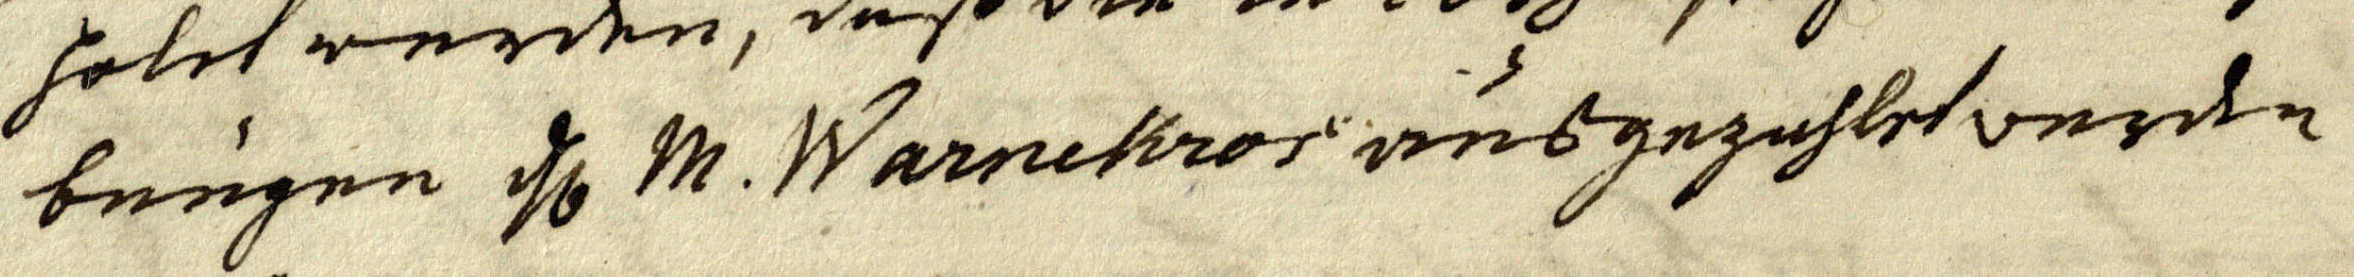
bungen dh M. Warnekros ausgezahlet werden
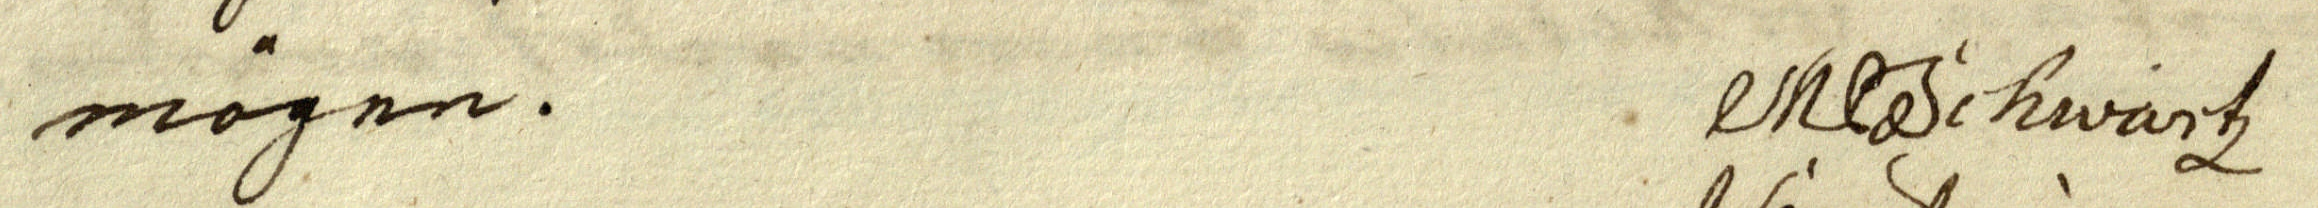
mögen. MC Schwartz
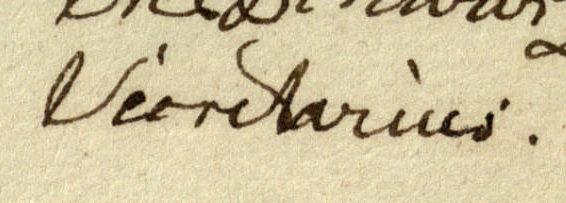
Secretarius
